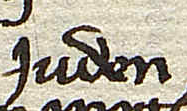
Iuden
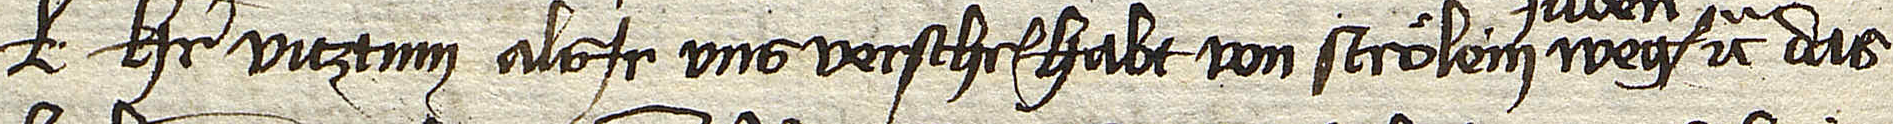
L* Hr* vicʒtum als Ir vns verſchr* habt von ſtrölein weg* ec* das
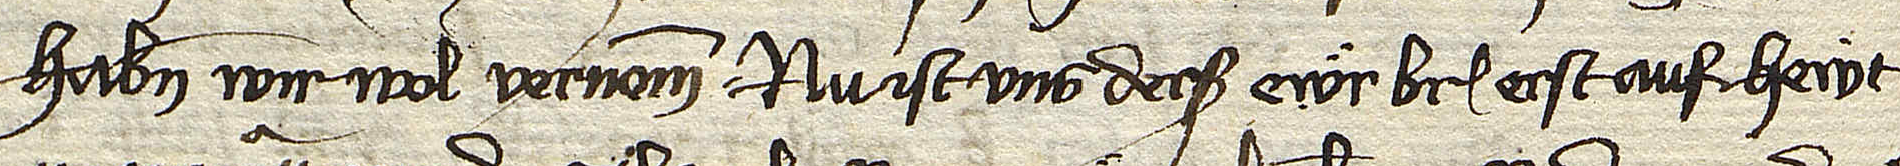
habn* wir wol vernom* / Nu iſt vns derſ* eẅr br* erſt auf heẅt
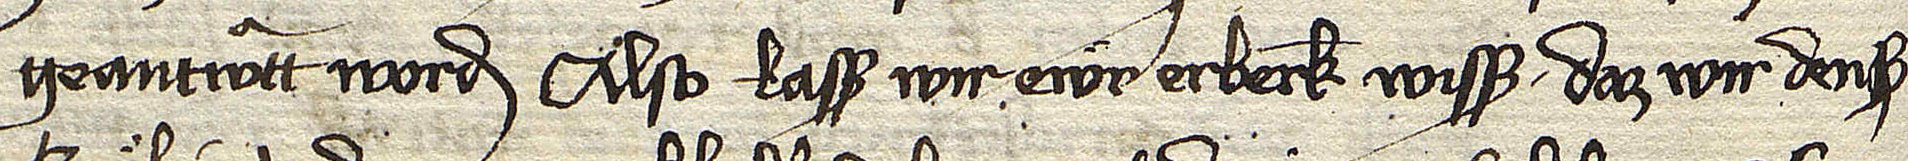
geantw*tt word* Alſo laſſ* wir eẅr erberk* wiſſ* / daʒ wir denſ*
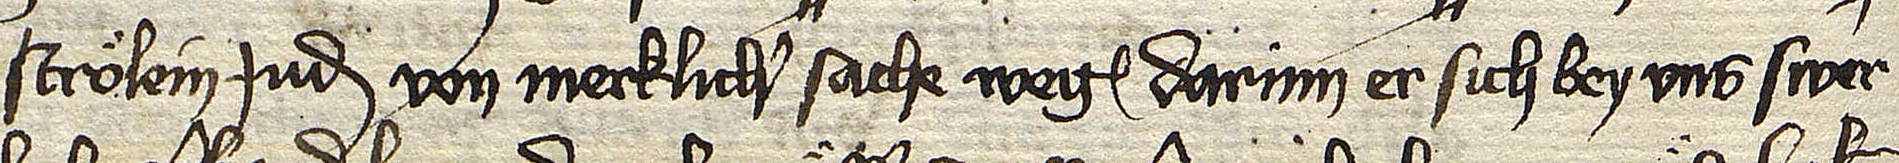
ſtrölein Iud von merklich* ſache weg* darinn er ſich bey vns ſwer
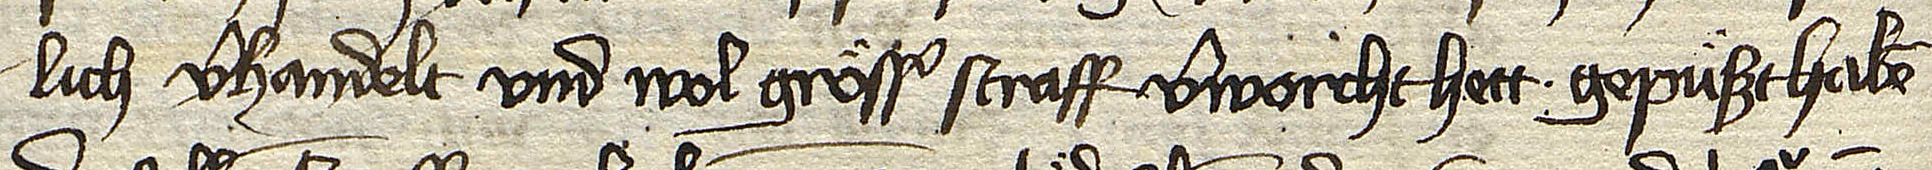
lich v*handelt vnd wol gröſſ* ſtraff v*worcht hett . gepüſʒt habe*
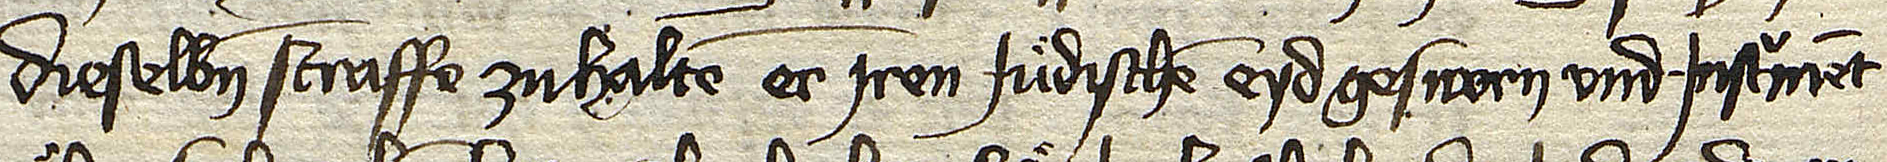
Dieſelbn* ſtraffe ʒuhalte* er Iren Iüdiſche* eyd geſworn vnd Inſtrume*t
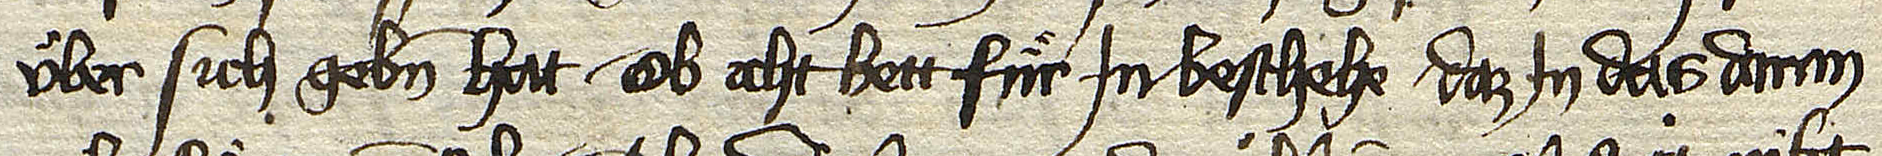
v̈ber ſich gebn* hat / Ob icht bett für In beſchehe / daʒ In das daran
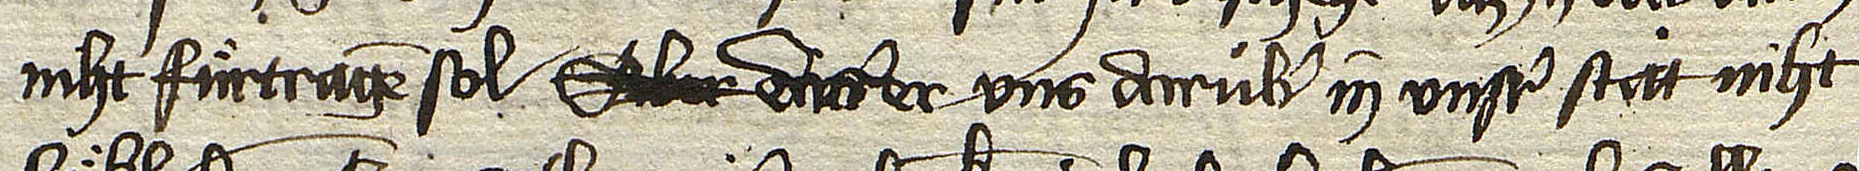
niht fürtrage* ſol Aber Das er vns darüb* in vnſr* ſtat niht
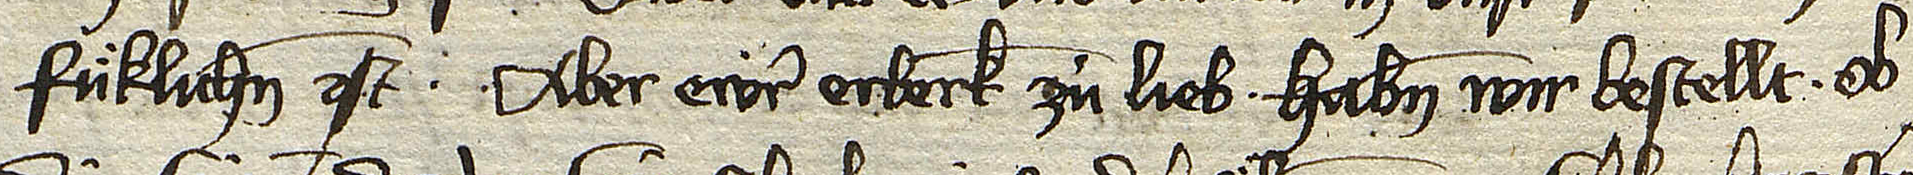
füklichn* iſt . Aber eẅr* erberk* ʒü lieb . habn* wir beſtellt . Ob
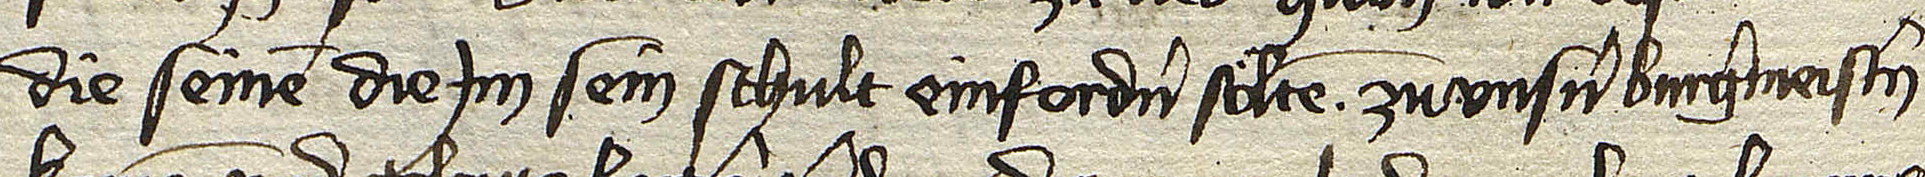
die ſeine* die Im ſein ſchult einfordn* ſölte* . ʒu vnſn* burg*meiſt*n
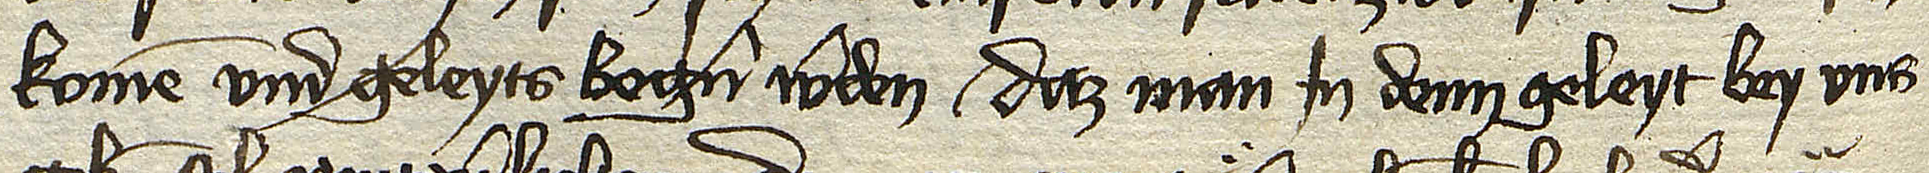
kome* vnd geleyts beg*n w*den / daʒ man In denn geleyt bey vns
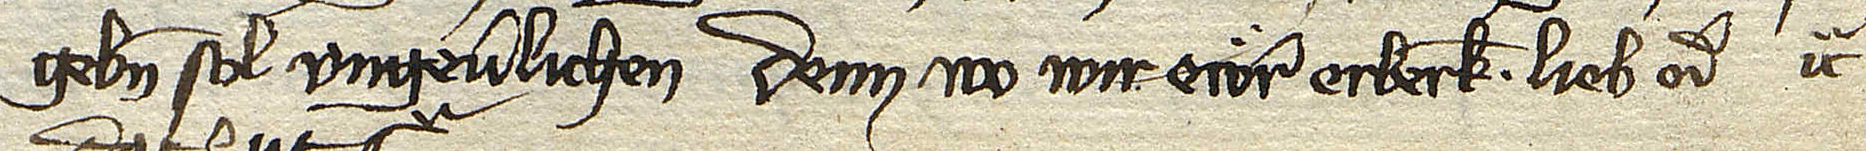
gebn* ſol vngeu*lichen Denn wo wir eẅr* erberk* . lieb od* ec*
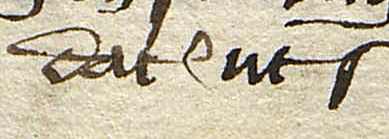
Dat* ut ſ*
